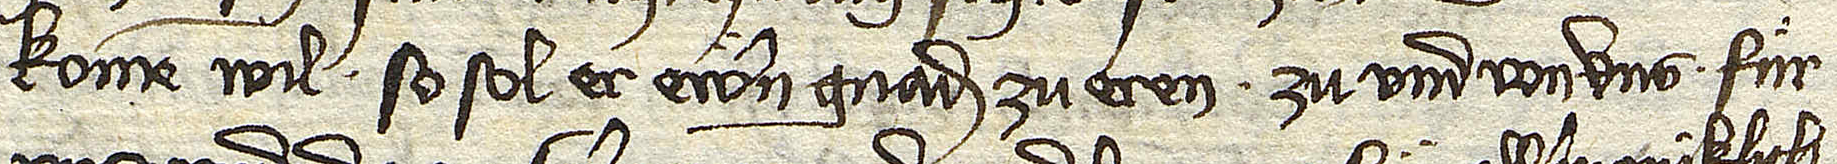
kome* wil . ſo ſol er ew*n gnad* ʒu eren . ʒu vnd von Vns . für
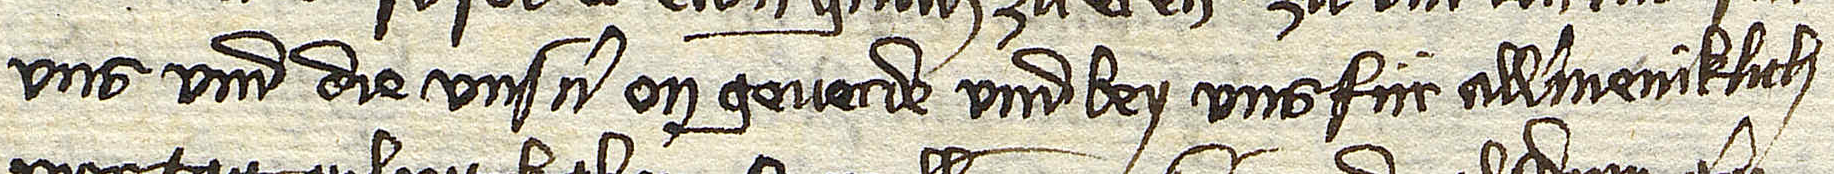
vns vnd die vnſ*n on geuerde vnd bey vns für all*meniklich
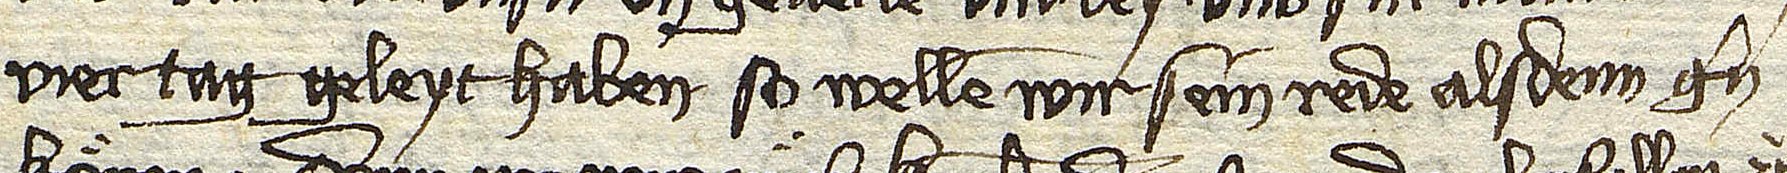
vier tag geleyt haben . ſo welle* wir ſein rede alſdenn g*n
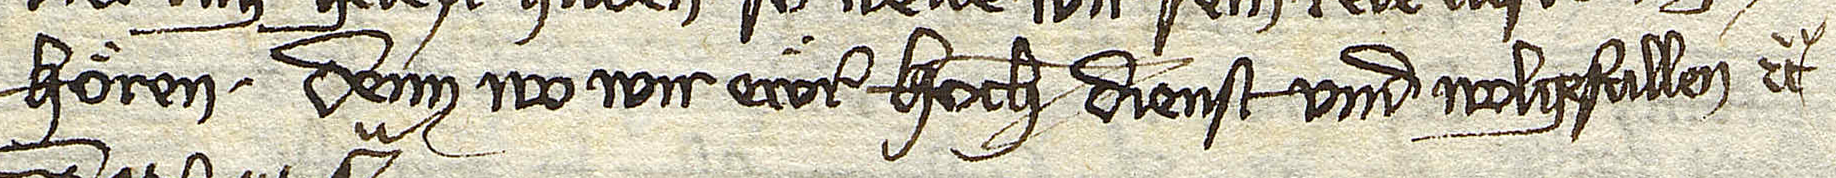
hören . Denn wo wir ew*r hoch* dienſt vnd wolgefallen ec*
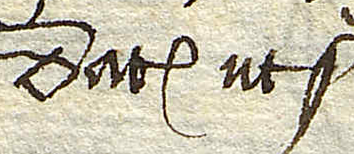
Dat* ut ſ*
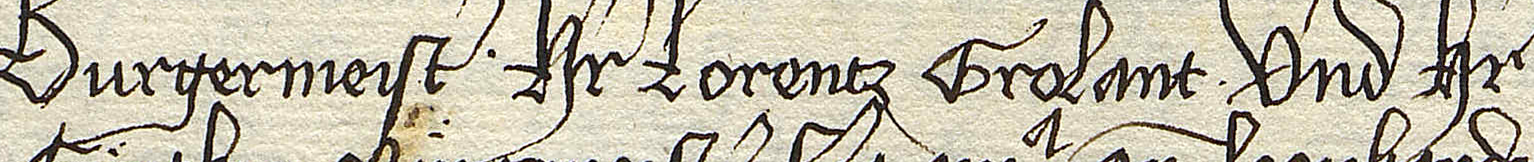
Burgermeiſt* . H*r Lorencʒ Grolant . Vnd H*r
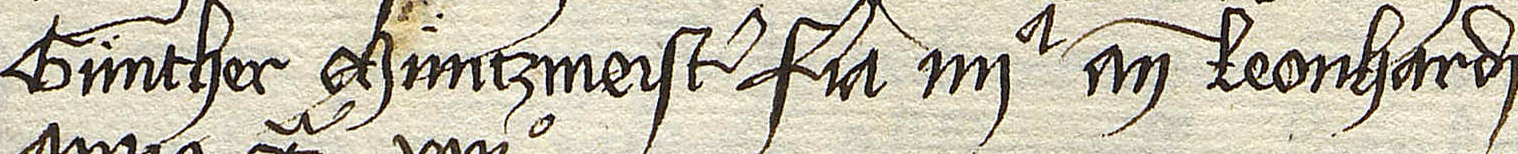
Günther Müncʒmeiſt* fia* iiii* an* Leonhardi
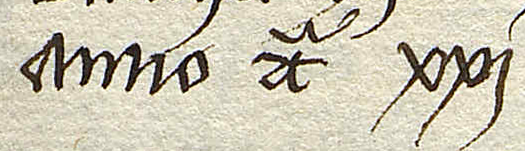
anno ec* xxi*
